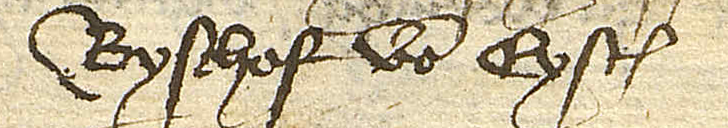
Byſchof vo* Eyſt*
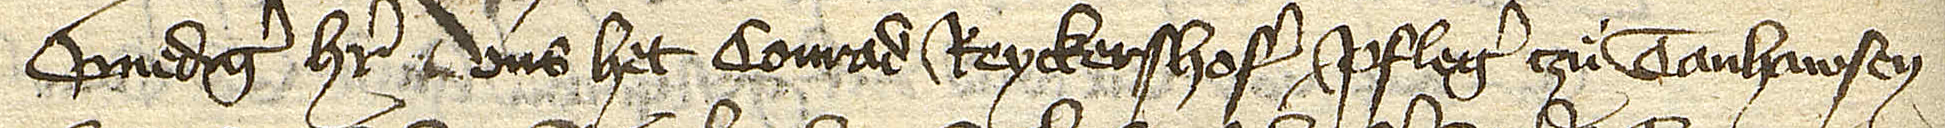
Gnedig* hr* / Vns het Conrad Reyckerſhof* / Pfleg* cʒü Tanhawſen
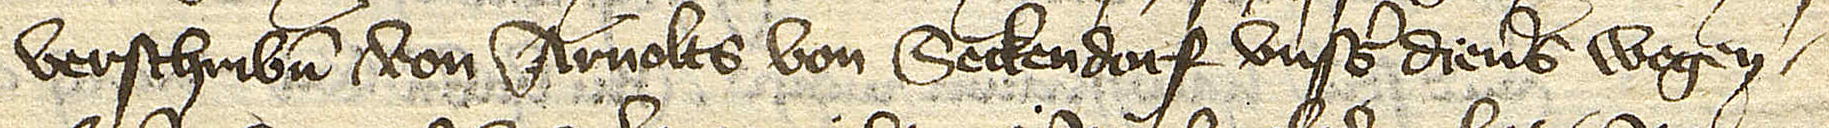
verſchribn* / von Arnolts von Seckendorf vnſs* dien*s wegen /
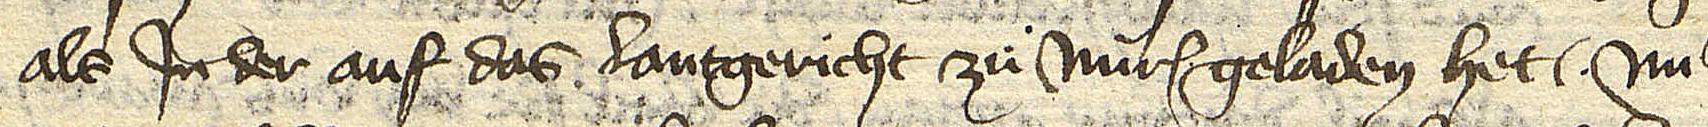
als In der auf das lantgericht cʒü Nür* geladen het / . Nu
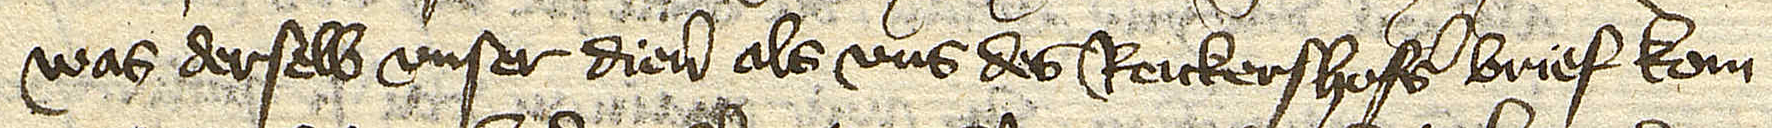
was derſelb vnſer dien* als vns des Reickerſhofs* brief kom
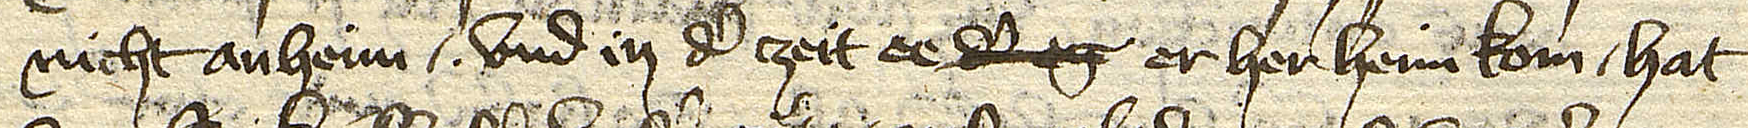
nicht anheim / . vnd in d* cʒeit ee d* eg er her heim kom / hat
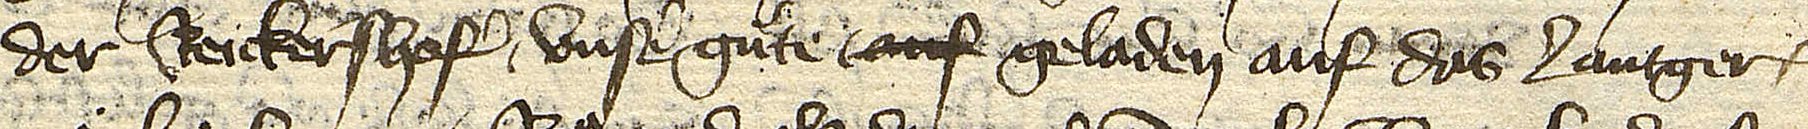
der Reickerſhof* / vnſe* güte / auf geladen auf das Lantger*
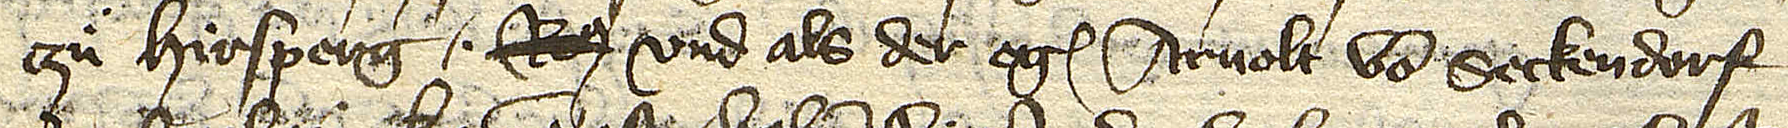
cʒü Hirſperg / . Ro* vnd als der eg* Arnolt vo* Seckendorf
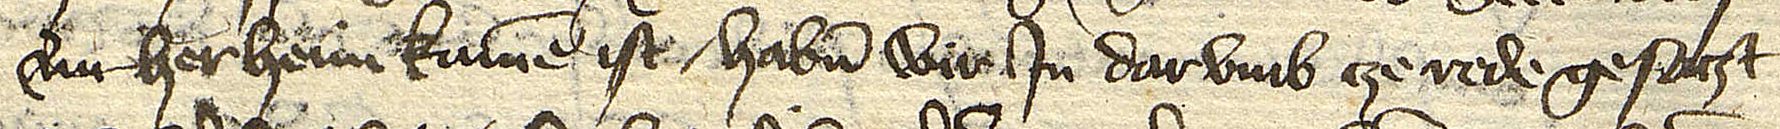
nu herheim kume* iſt / habn* wir In darvmb cʒe rede geſacʒt
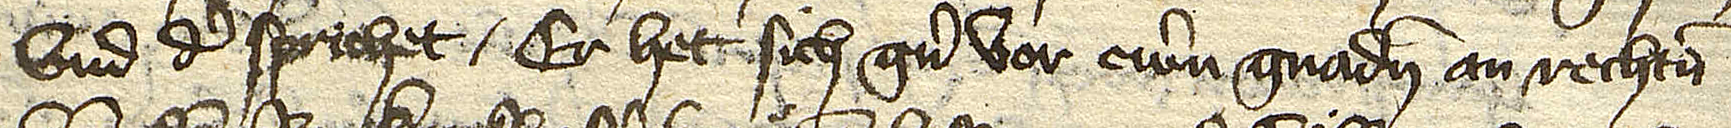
vnd d* ſprichet / Er het ſich gn* vor ew*n gnadn* an rechtn*
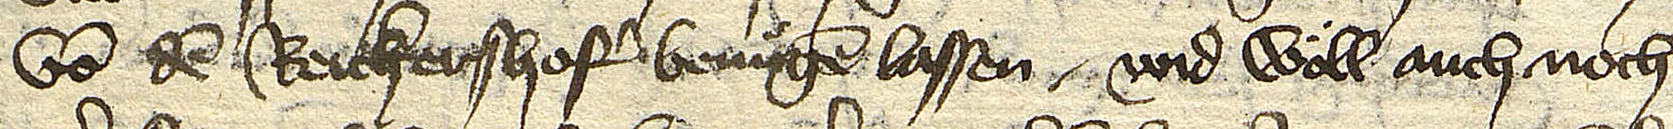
vo* de* Reicherſhof* benüge* laſſen / vnd wöll auch noch
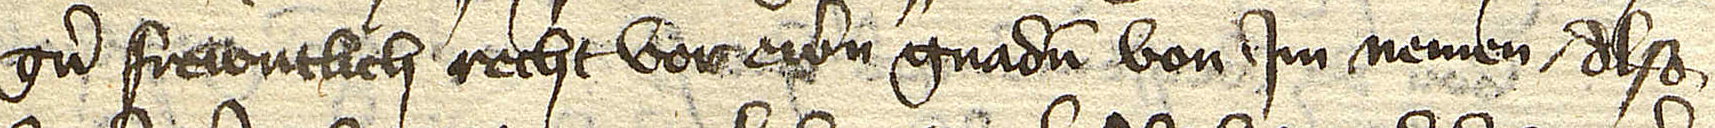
gn* frewntlich recht vor ew*n gnadn* von Im nemen / Alſo
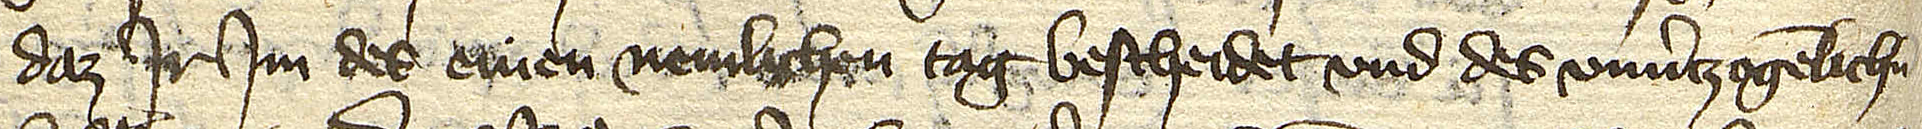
daʒ Ir Im des einen nemlichen tag beſcheidet vnd des vnu*cʒoge*lichn*
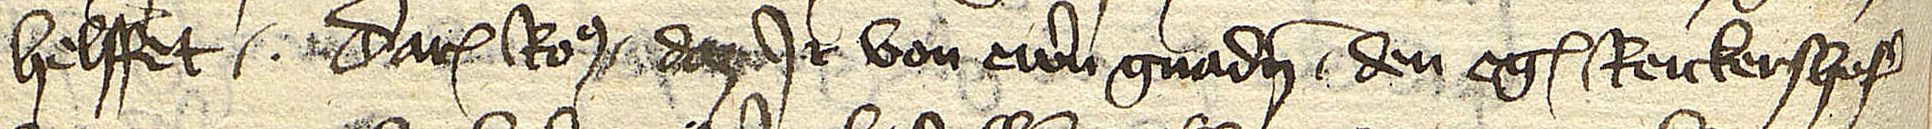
helffet / . Dar* Ro* / daʒ Ir von ew*n gnadn* / den eg* Reickerſhof*
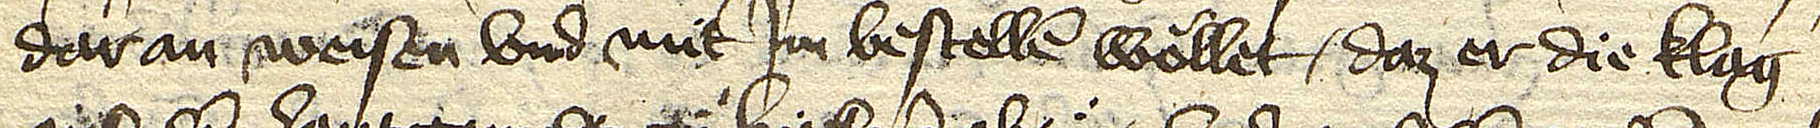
daran weiſen vnd mit Im beſtelle* wöllet / daʒ er die klag
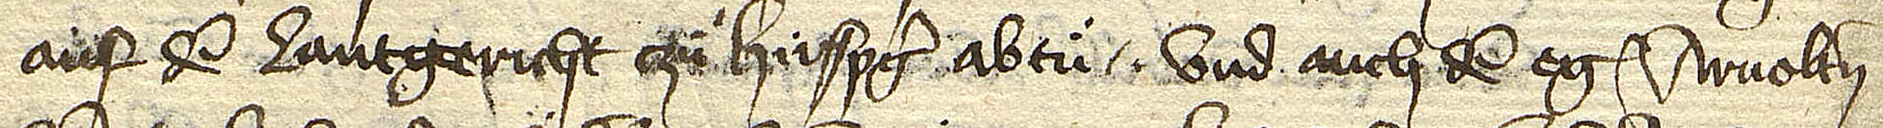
auf de* Lantgericht cʒü hirſpg* abtü / . vnd auch d* eg* Arnoltn*
